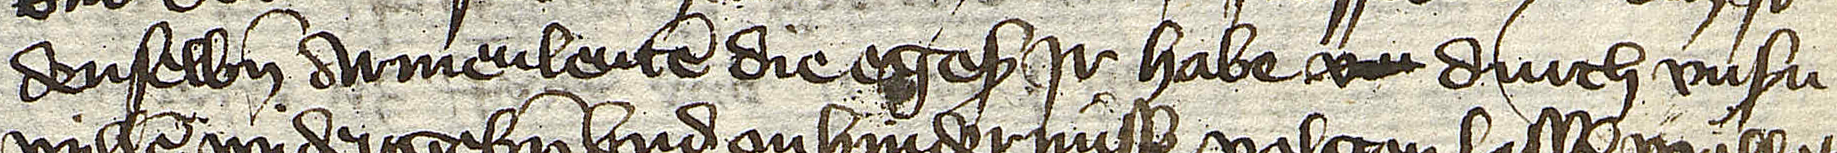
denſelbn* Armenleute* die egeſ* Ir habe von durch vnſ*n
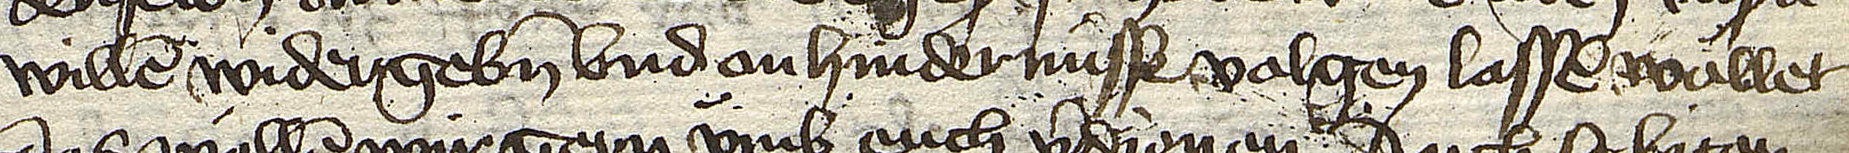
wille* widergebn* vnd on hindernüſſe volgen laſſe* wöllet
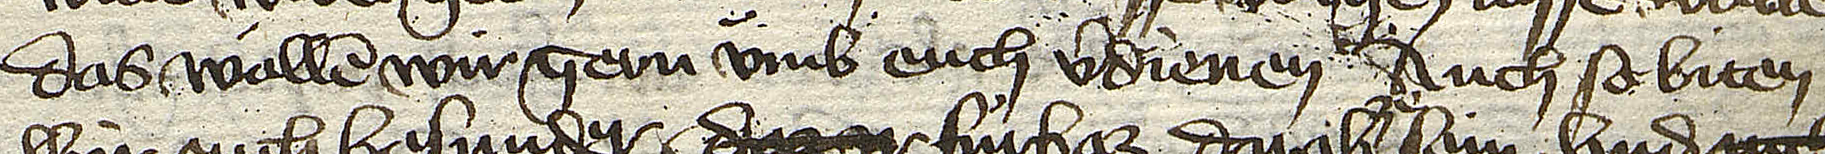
Das wölle* wir gern v̈mb euch v*dienen Auch ſo biten
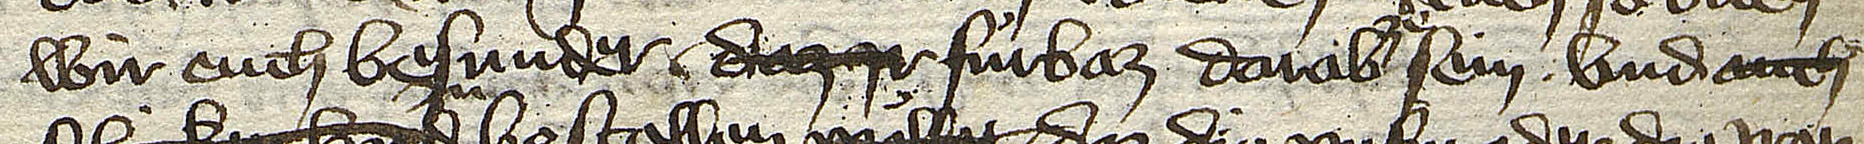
wir euch beſunder / daʒ Ir fürbaʒ darob ſein . vnd auch
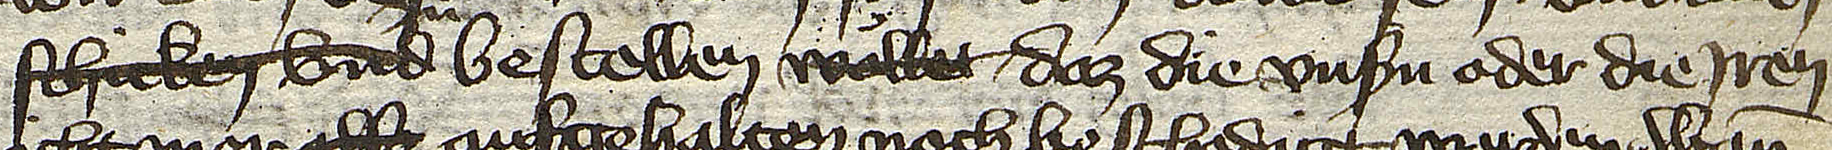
ſchicken vnd beſtellen wöllet / daʒ die vnſ*n oder die Iren
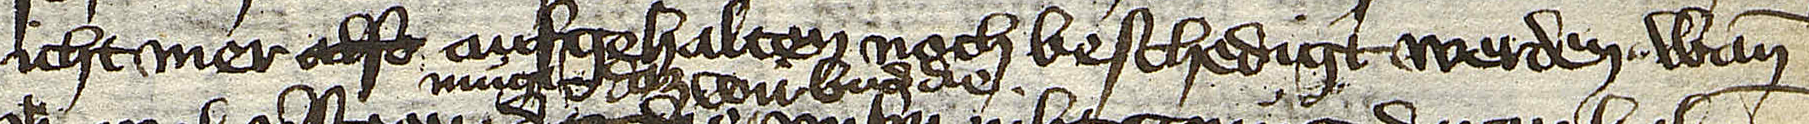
icht mer alſo aufgehalten noch beſchedigt werden ~ wan*
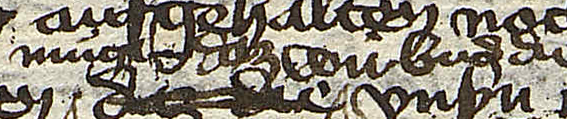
mügt daʒ wir vnd die
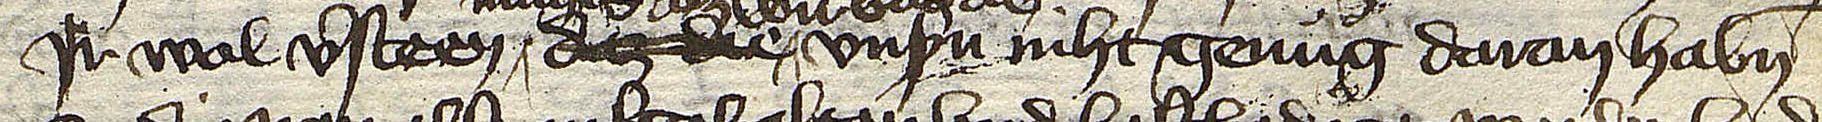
Ir wol v*ſteen daʒ die vnſ*n niht genüg daran habn*
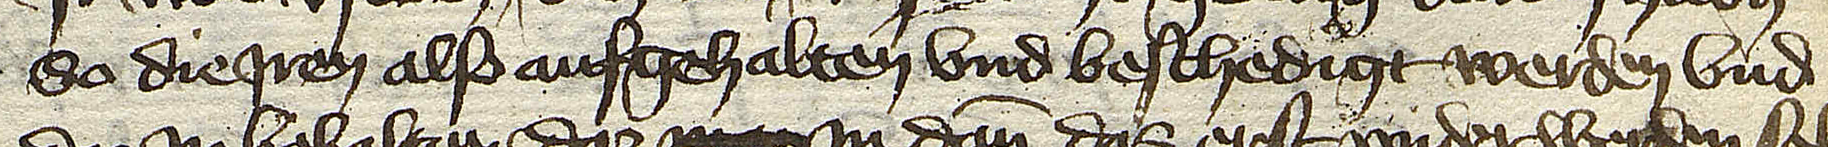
So die Iren alſo aufgehalten vnd beſchedigt werden vnd
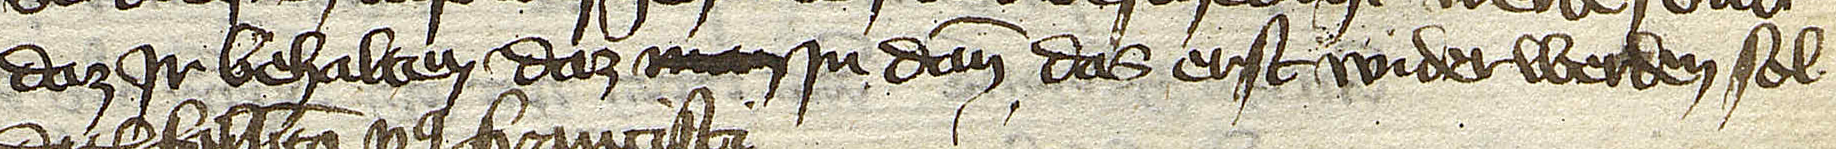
daʒ Ir behalten / daʒ man In dan* das erſt wider werden ſol
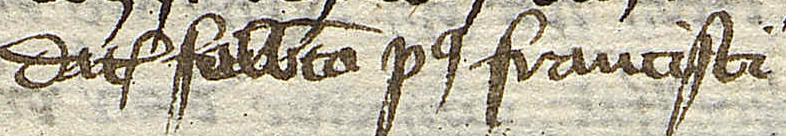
Dat* ſabbto* p* franciſci
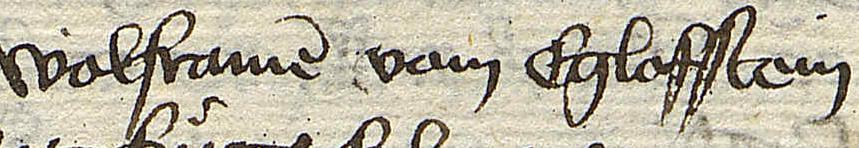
Wolframe* vom Eglofſtein
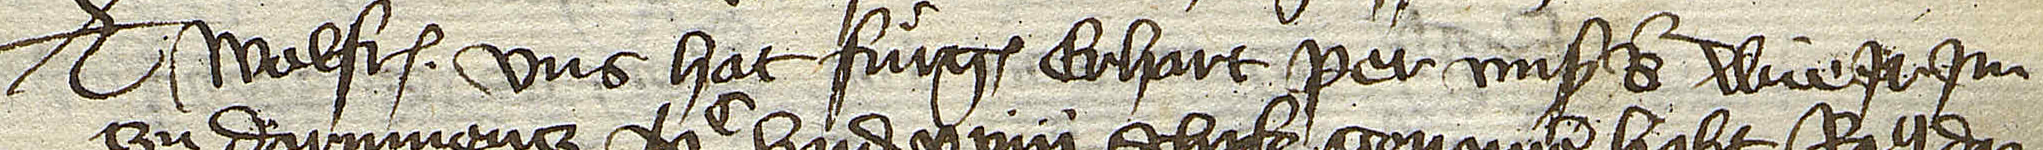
L* wolfr* . vnd hat fürg* Erhart Per vnſ* B* wie Ir Im
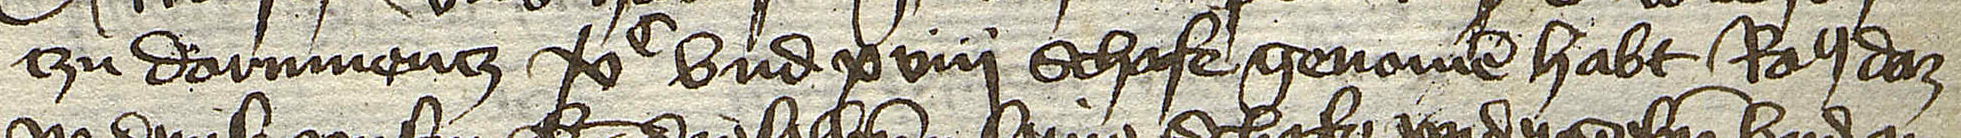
cʒu dormnencʒ xv* vnd xviii Schafe genome* habt Ro* daʒ
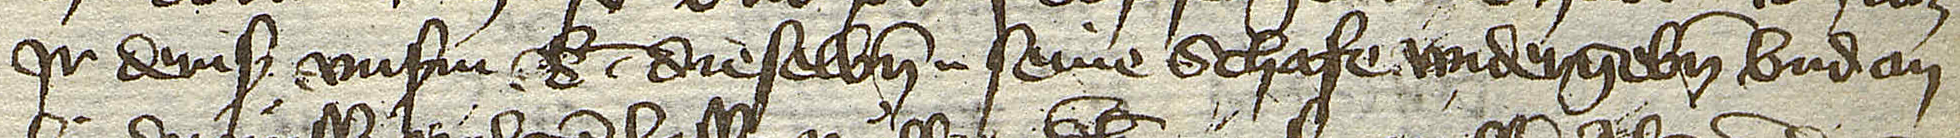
Ir demſ* vnſ*m B* / dieſelbn* ~ ſeine Schafe widergebn* vnd on
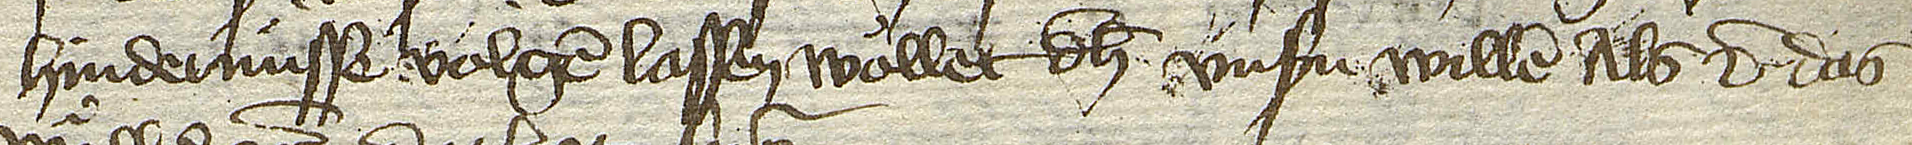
hindernüſſe volge* laſſen wöllet dh* vnſ*n wille* Als ec* Das
